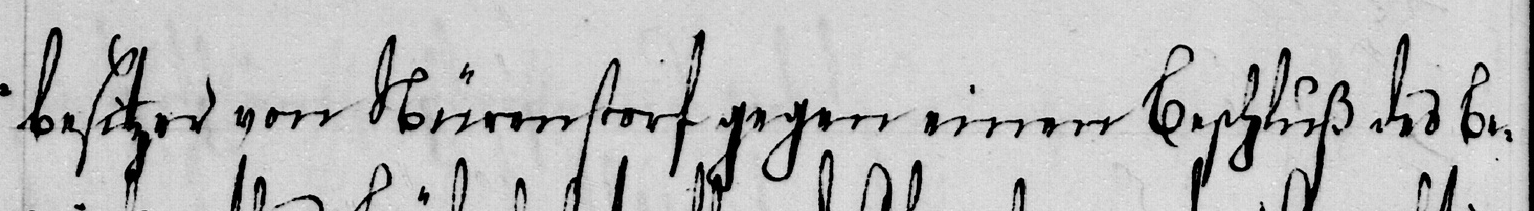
besitzer von Nürenstorf gegen einen Beschluß des Be¬
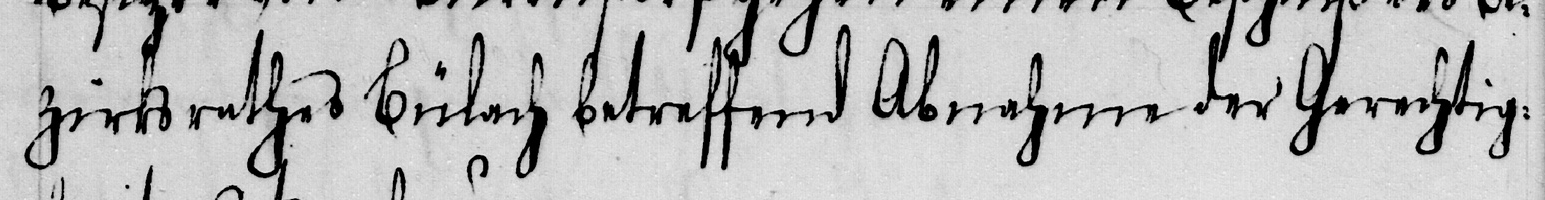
zirksrathes Bülach betreffend Abnahme der Gerechtig¬
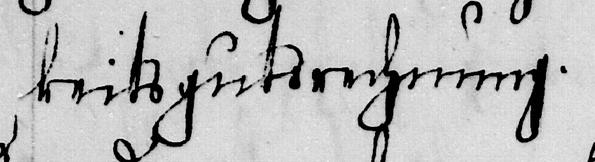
keitsgutsrechnung.
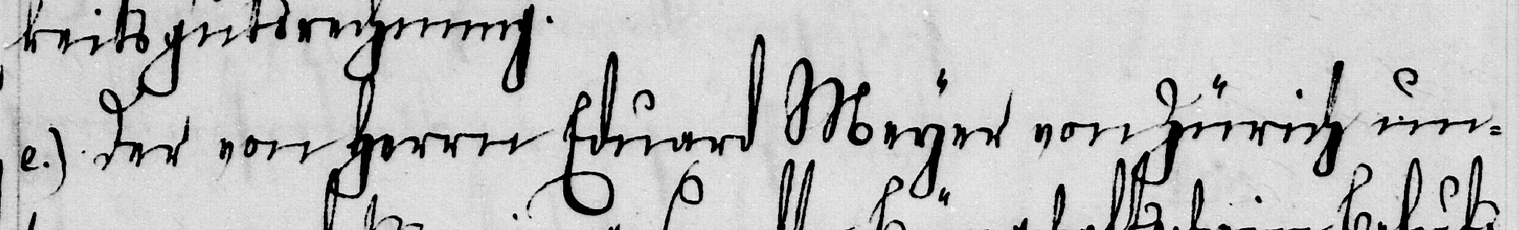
e.) Der von Herrn Eduart Meyer von Zürich un¬
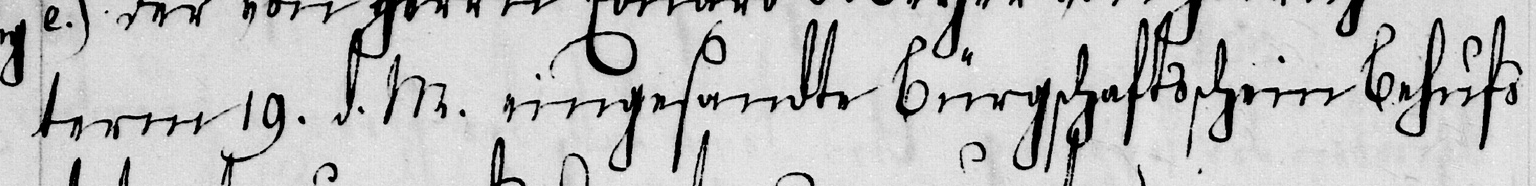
term 19. d. M. eingesandte Bürgschaftsschein Behufs
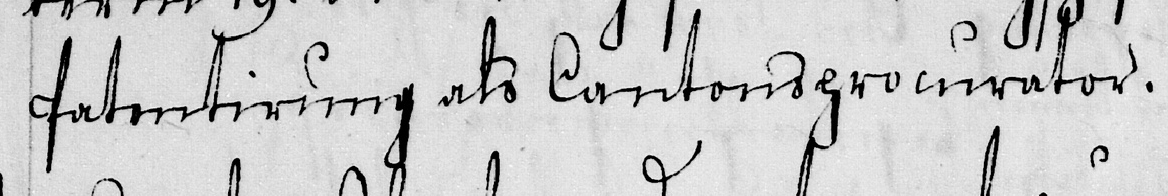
Patentirung als Cantonsprocurator.
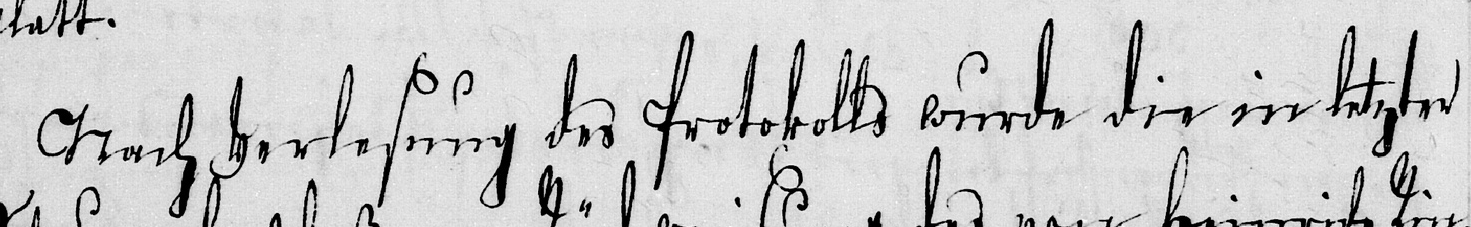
Nach Verlesung des Protokolls wurde die in letzter
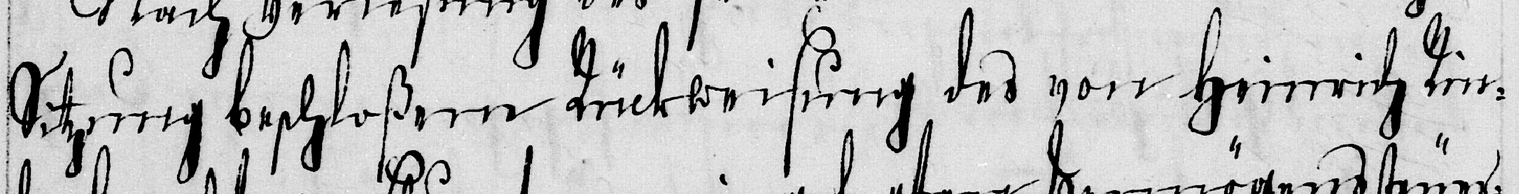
Sitzung beschloßene Rückweisung des von Heinrich Rin¬
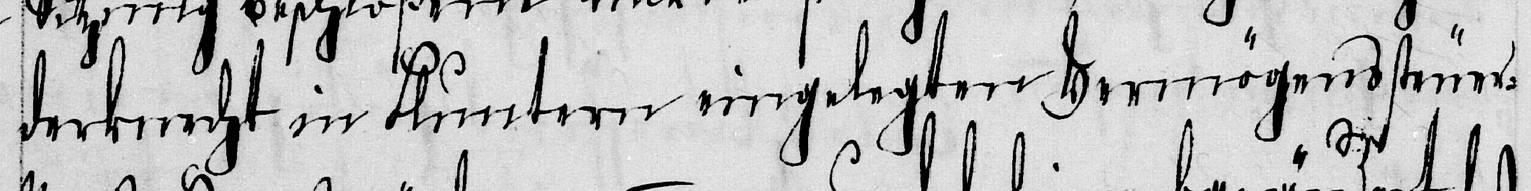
derknecht in Fluntern eingelegten Vermögenssteue¬
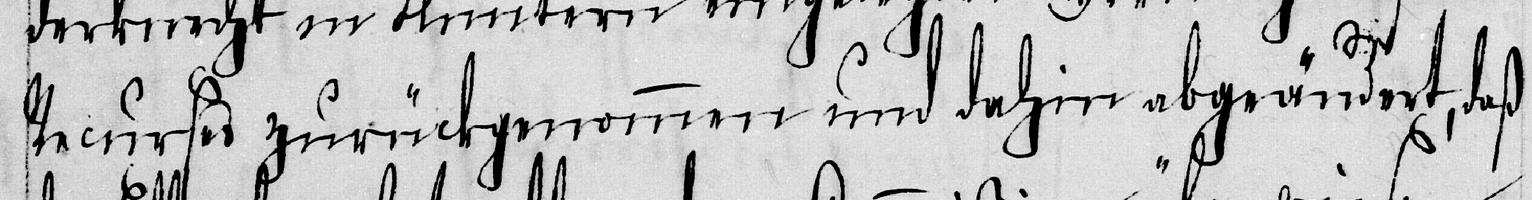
ecurses zurückgenommen und dahin abgeändert, daß
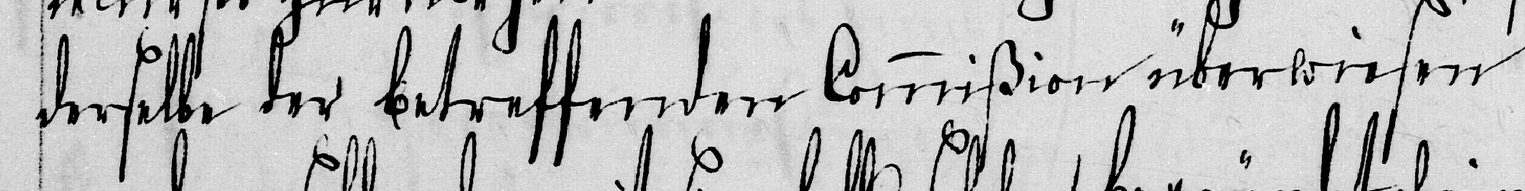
derselbe der betreffenden Commißion überwiesen
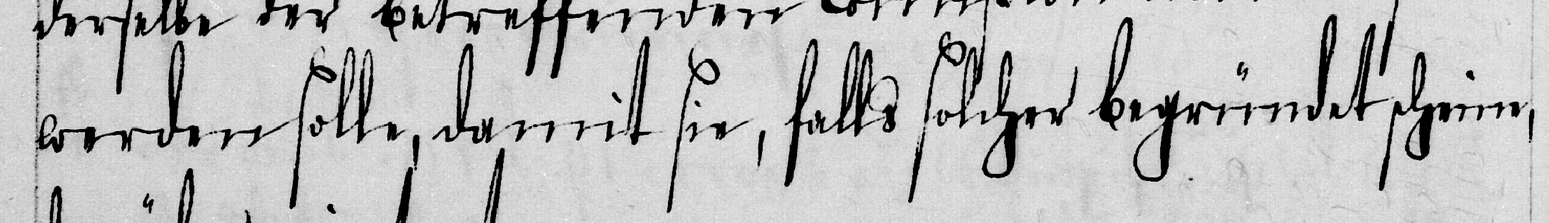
werden solle, damit sie, falls solcher
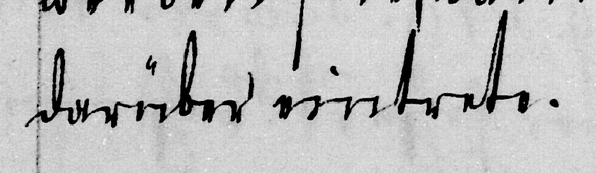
darüber eintrete.
